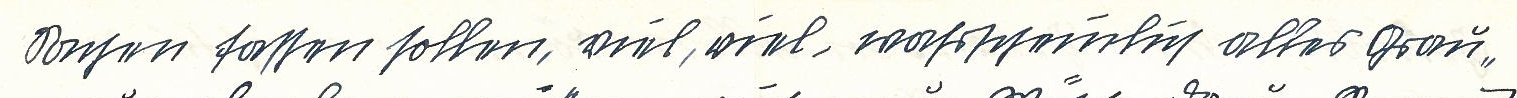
Sachen fassen sollen, viel, viel, wahrscheinlich alles Grau¬
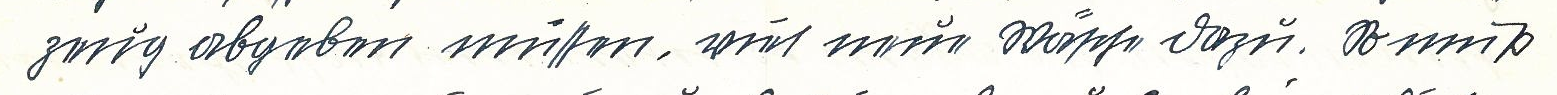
zeug abgeben müssen, viel neue Wäsche dazu. So muß
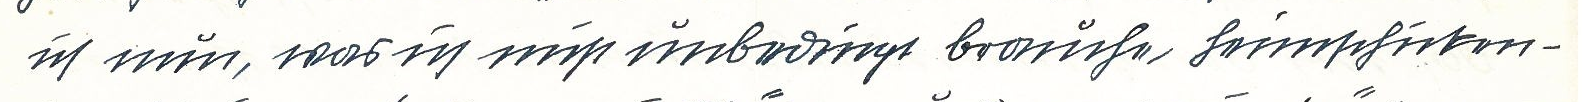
ich nun, was ich nicht unbedingt brauche, heimschicken –
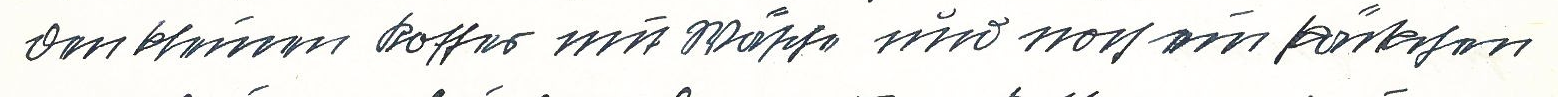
den kleinen Koffer mit Wäsche und noch ein Päckchen
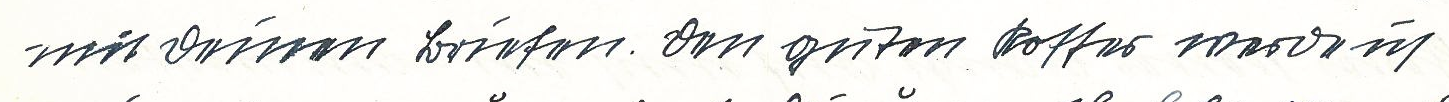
mit Deinen Briefen. Den guten Koffer werde ich
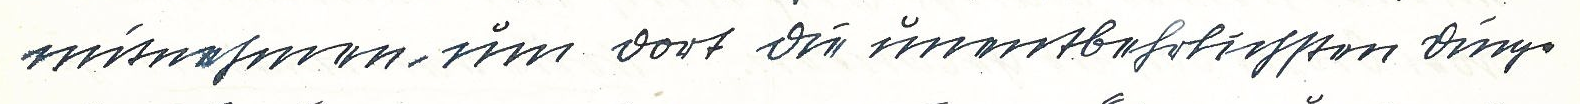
mitnehmen, um dort die unentbehrlichsten Dinge
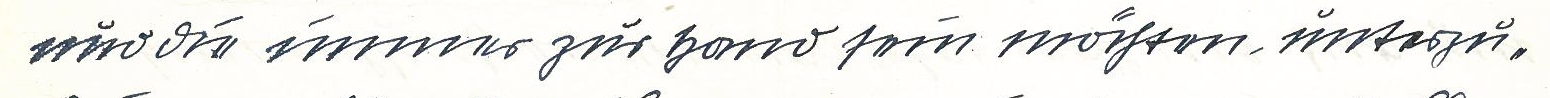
und die immer zur Hand sein möchten, unterzu¬
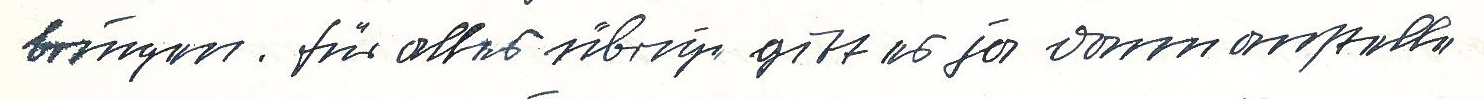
bringen. Für alles übrige gibt es ja dann anstelle
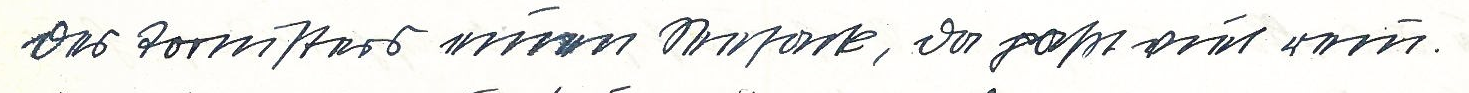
des Tornisters einen Rucksack, da paßt viel rein.
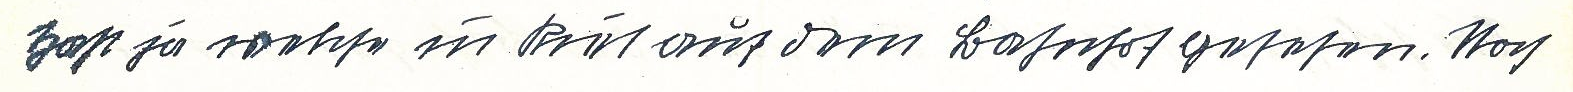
Hast ja welche in Kiel auf dem Bahnhof gesehen. Noch
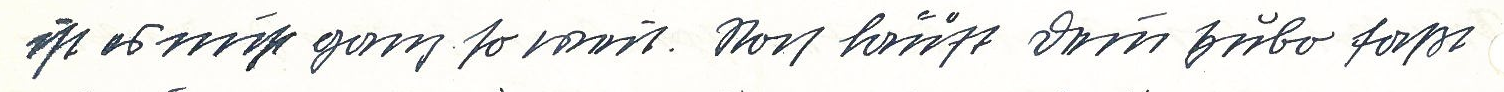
ist es nicht ganz so weit. Noch läuft Dein Hubo faßt
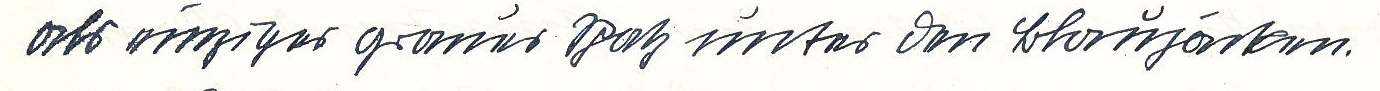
als einziger grauer Spatz unter den Blaujacken.
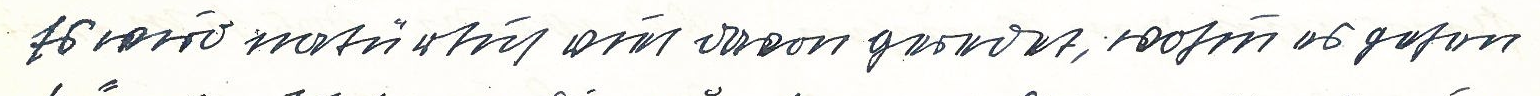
Es wird natürlich viel davon geredet, wohin es gehen
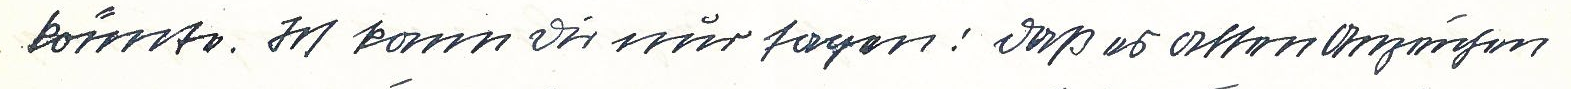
könnte. Ich kann Dir nur sagen: daß es allen Anzeichen
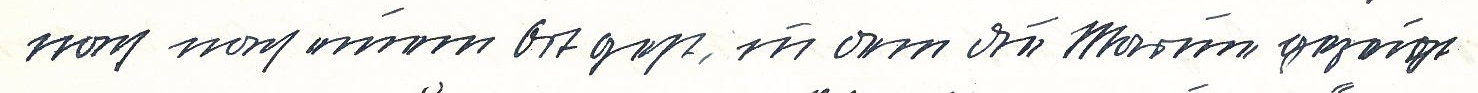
nach nach einem Ort geht, in dem die Marine gezeigt
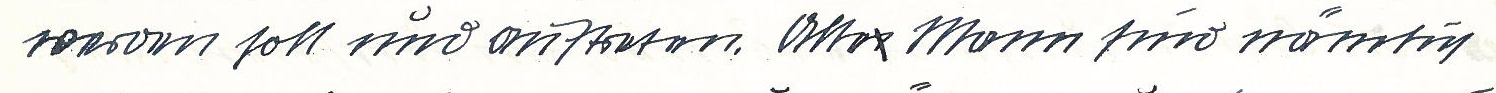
werden soll und auftreten. Alles Mann sind nämlich
